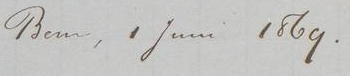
Bern, 1 Juni 1869.
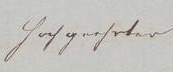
Hochgeehrter
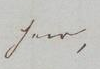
Herr,
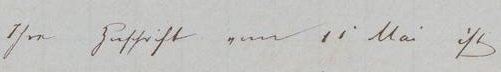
Ihre Zuschrift vom 11 Mai ist
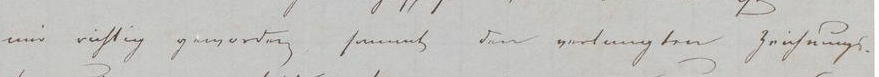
mir richtig geworden, sammt den verlangten Zeichnungs-
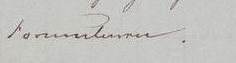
Formularen.
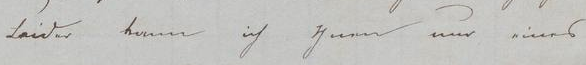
Leider kann ich Ihnen nur eines
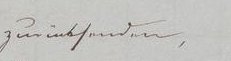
zurücksenden,
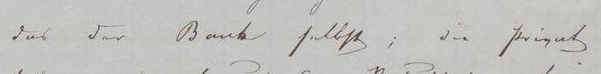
das der Bank selbst; die Privat-
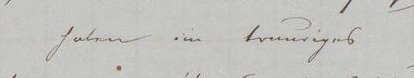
haben ein trauriges
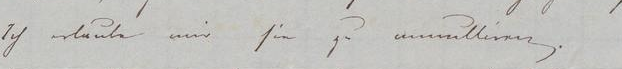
Ich erlaube mir sie zu annulliren.
